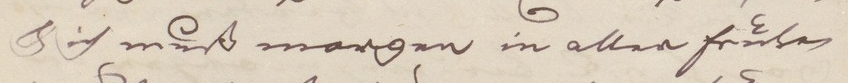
& ich muß morgen in aller Frühe
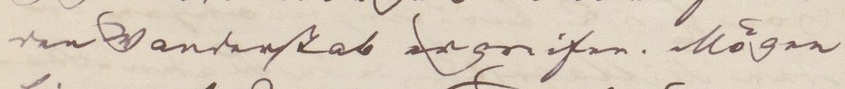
den Wanderstab ergreifen. Mögen
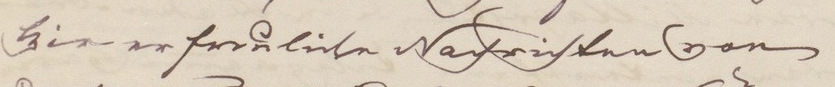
wir erfreuliche Nachrichten von
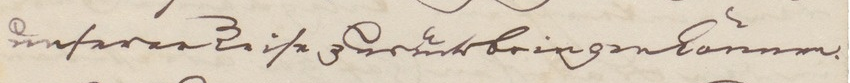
unserer Reise zurückbringen zu können.
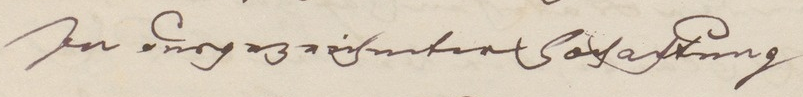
In ausgezeichneter Hochachtung
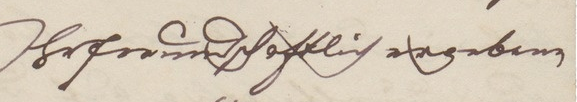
Ihr freundschaftlich ergebene
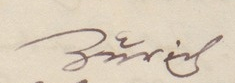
Zürich
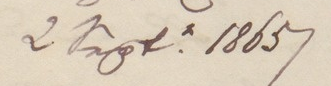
2 Septr 1865
